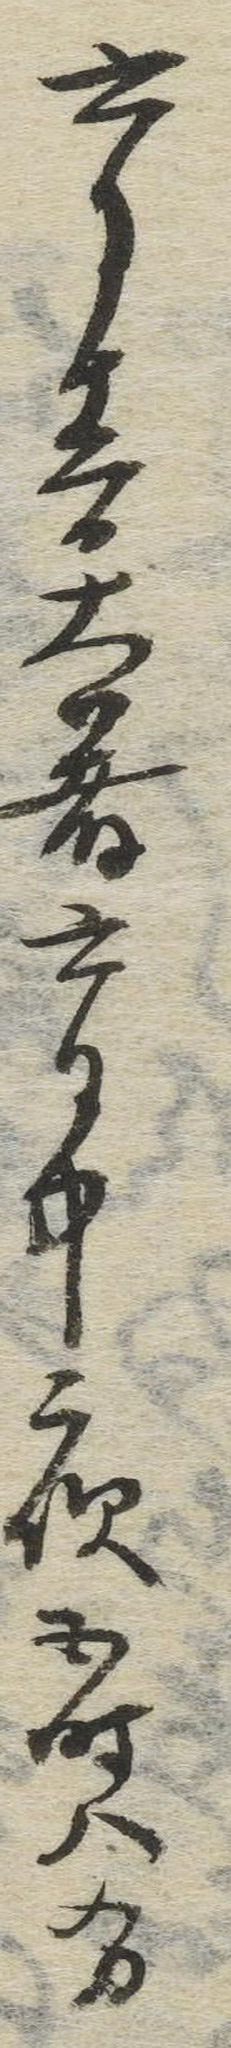六月十二日大暑六月中夜五時八分
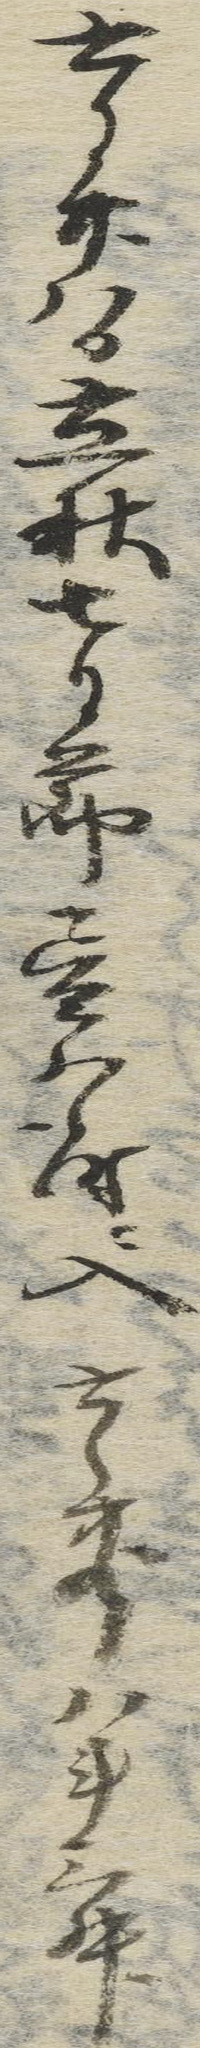六月廿八日立秋七月節昼八ツ時二入六月廿九日八斗三升
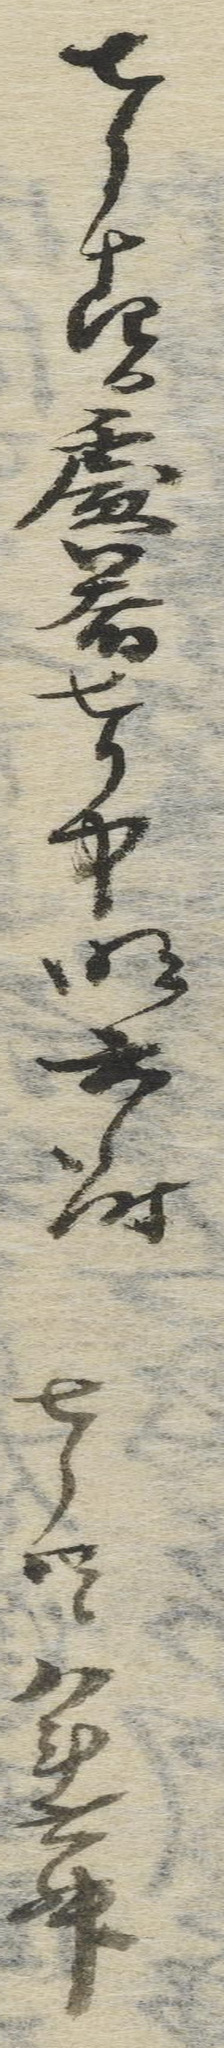七月十四日処暑七月中明六時七月四日八斗六升
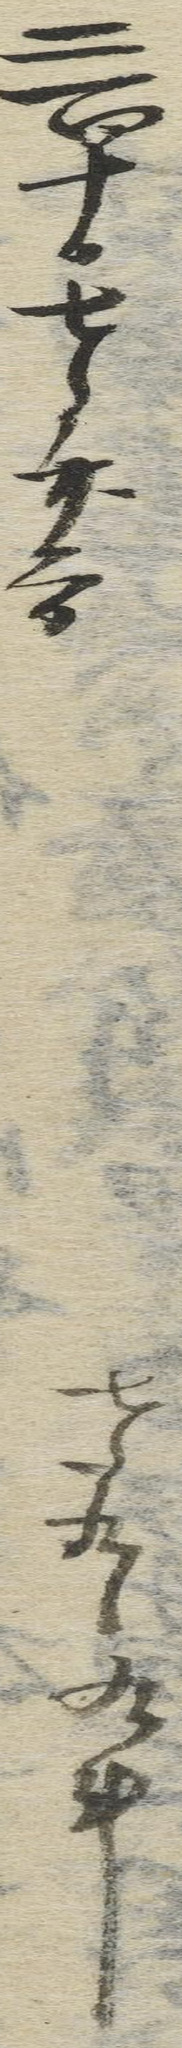二百十日七月廿二日七月九日九斗
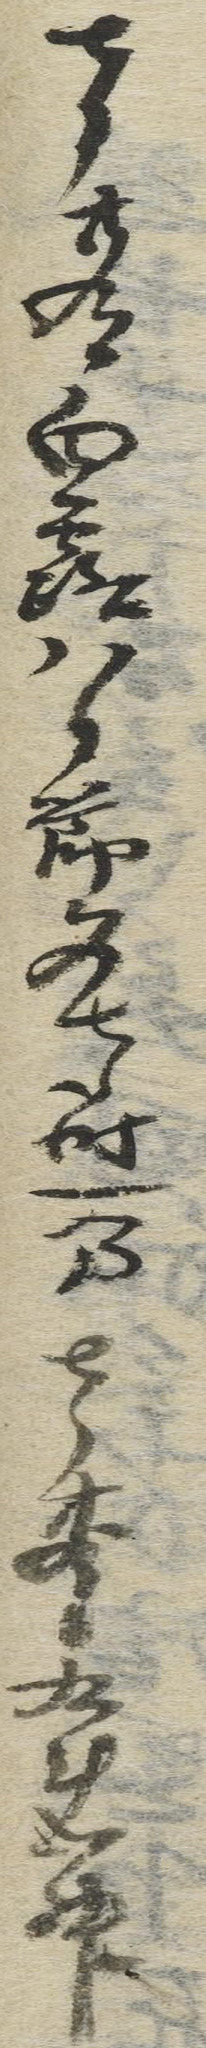七月廿九日白露八月節夕七ツ時一分七月廿九日九斗弐升
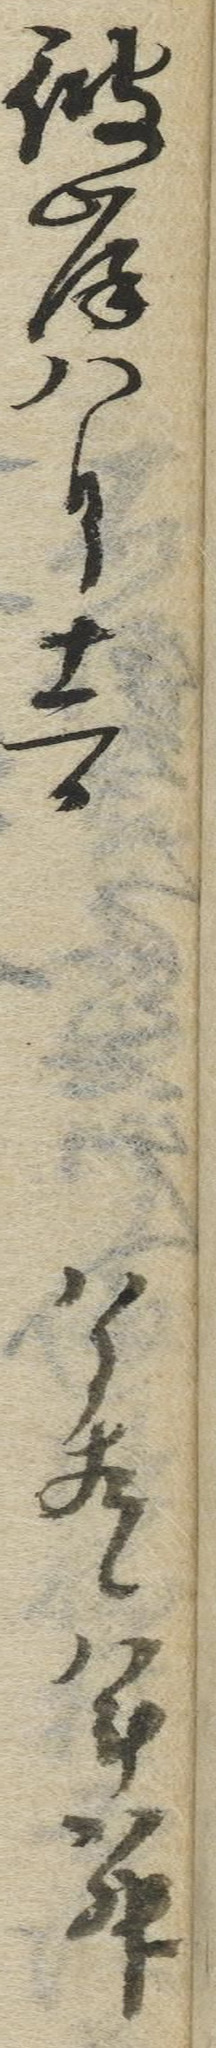彼岸八月十二日八月十九日八斗八升
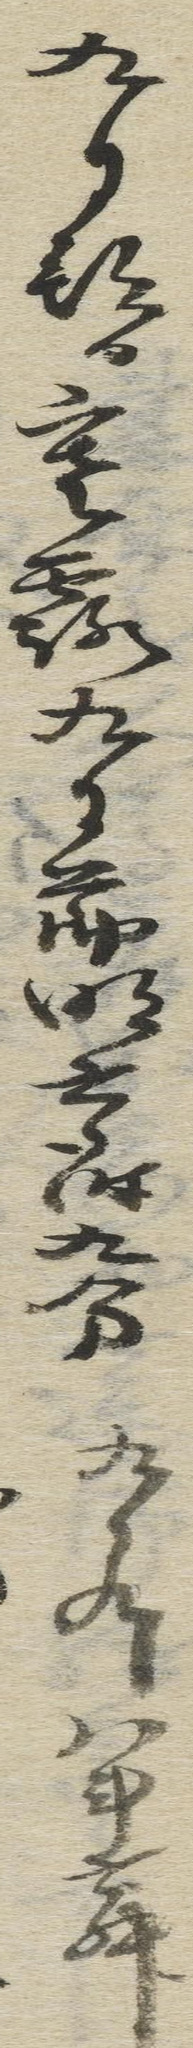九月朔日寒露九月節明け六ッ時九分九月九日八斗六升
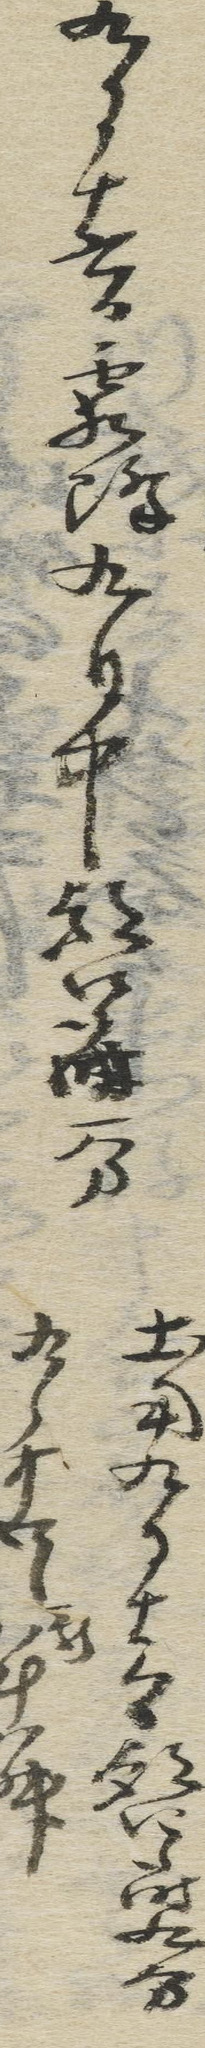九月十六日霜降九月中朝四ッ時一分土用九月十三日朝四ッ時九分
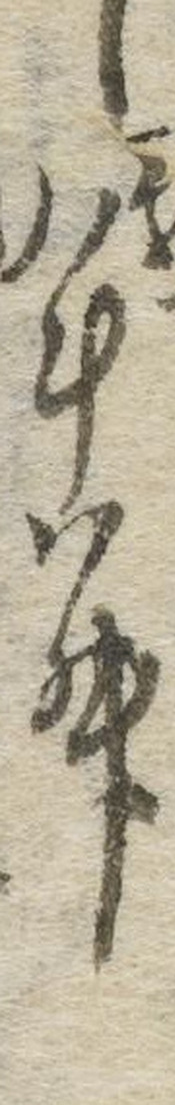古八斗四升
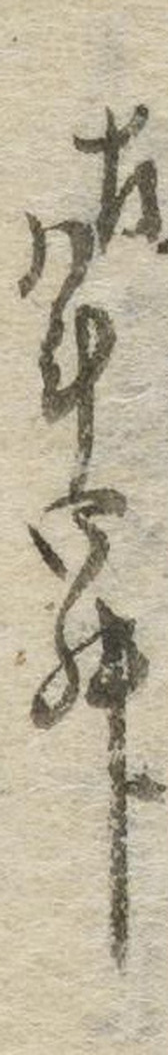古八斗四升
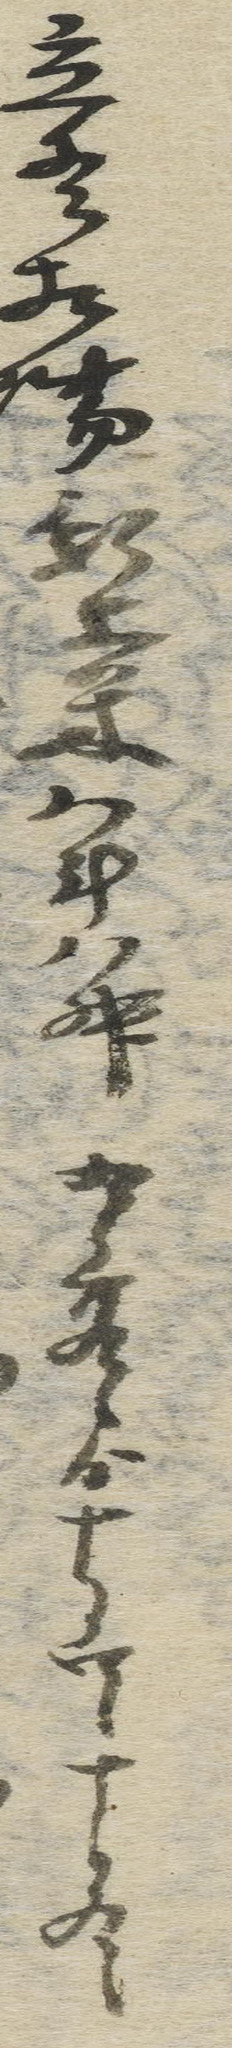立冬相場新上米八斗八升五月廿九日ゟ十月四日十月九日
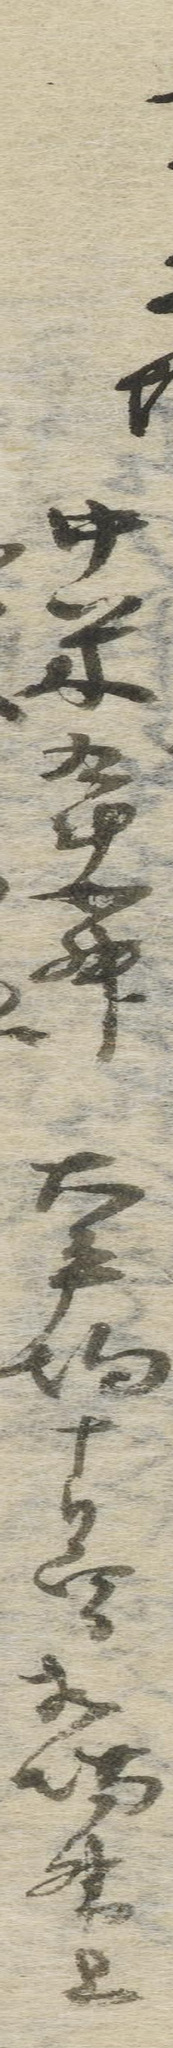中米九斗五升右平均十月四日相場書上
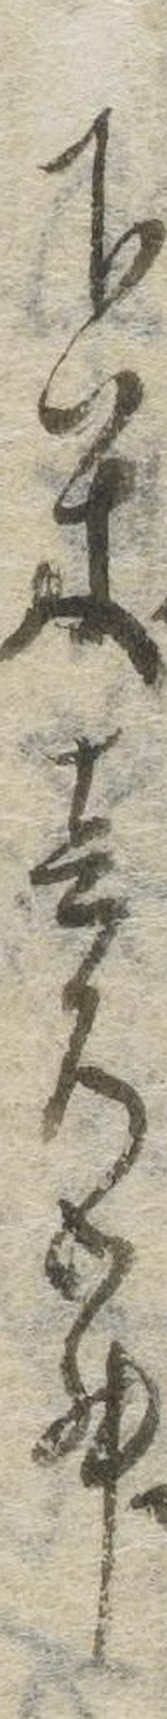下米壱人弐升
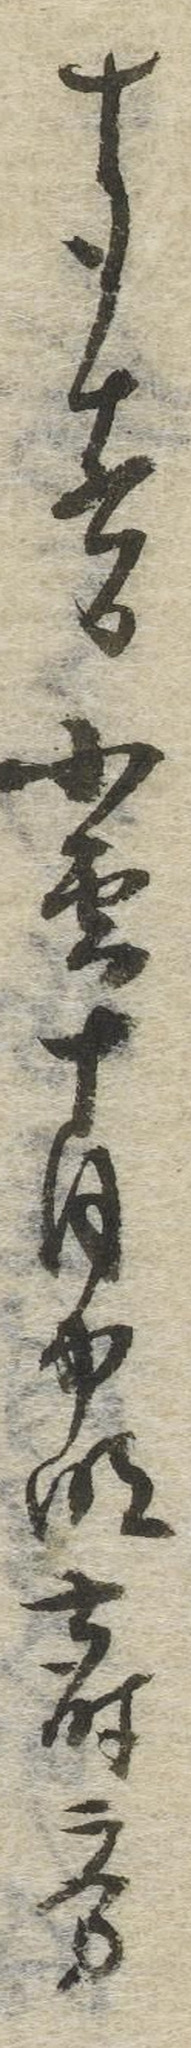十月十六日小雪十月中明六ッ時二分
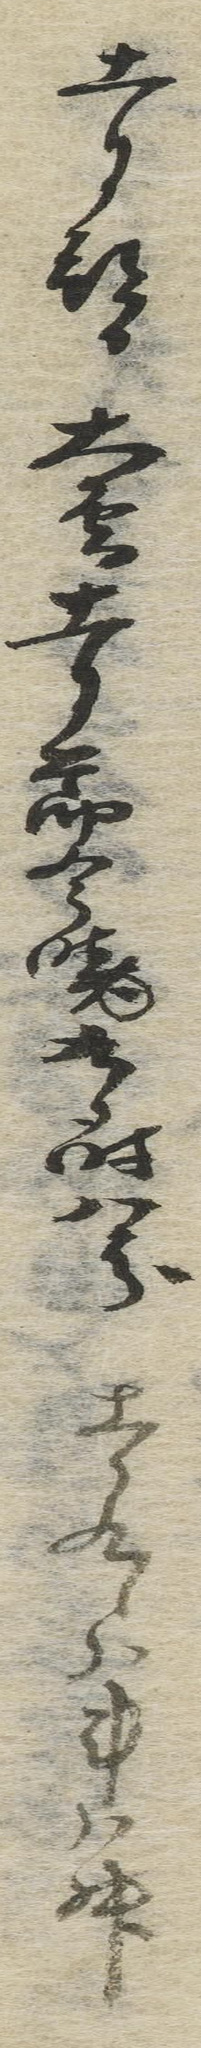十一月朔日大雪十一月節今暁九ッ時八分十一月九日八斗八升
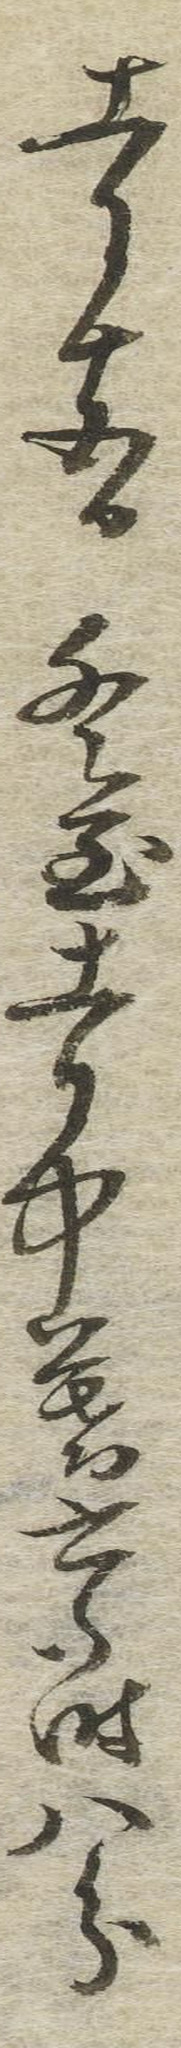十一月十五日冬至十一月中暮六ッ時八分
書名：信濃越後　地震書留
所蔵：東京大学地震研究所図書室 Earthquake Research Institute Library, The University of Tokyo, JAPAN
